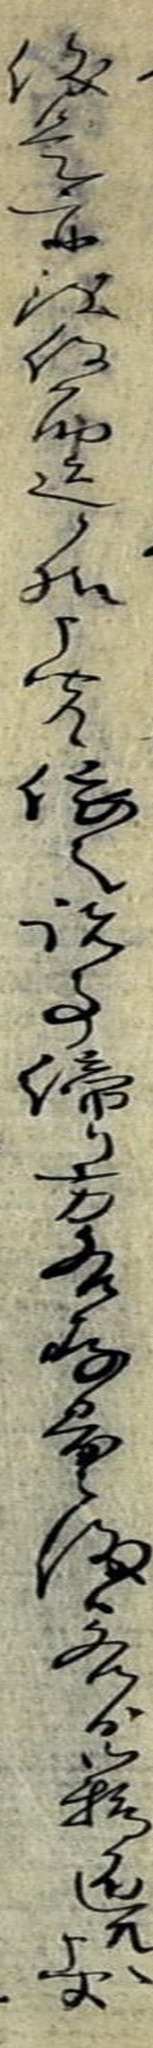儀是亦致役筋迄候様申聞候依之諸事締り方各存寄候儀ハ各ゟ御鵜匠共へ申聞
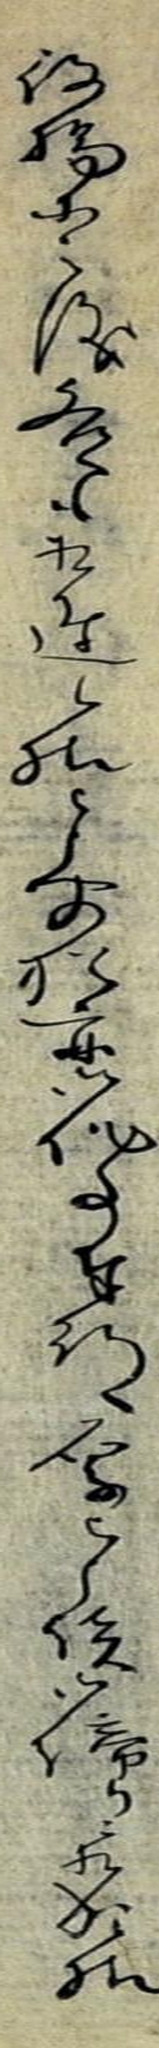役場等之儀各へも相達候様被申聞猶亦御作事奉行へ厚被申談御締りニ相成候様
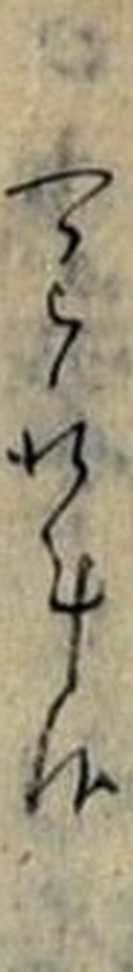可被取計候
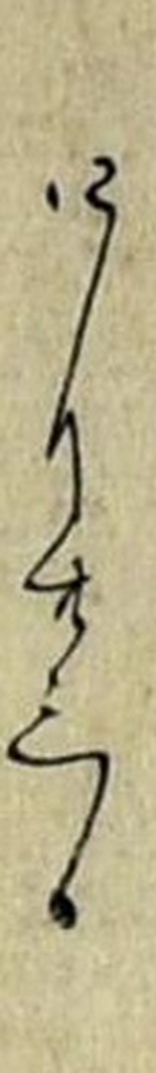四月廿三日
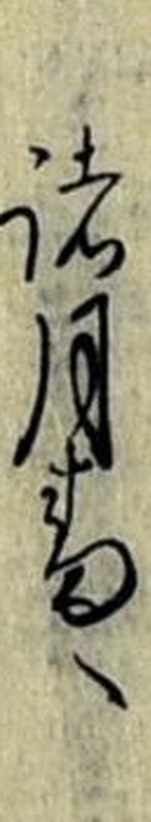諸月番へ
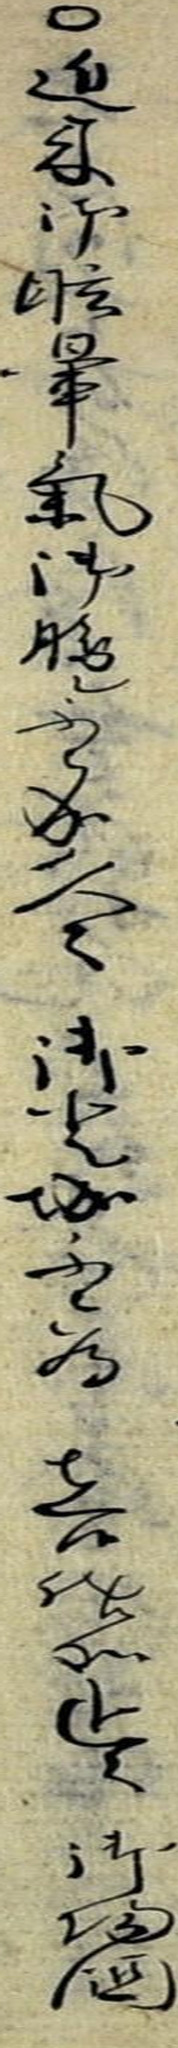〇近来御眩暈気御勝レ不被成久々御登城不被為在候然ル処追々御帰国
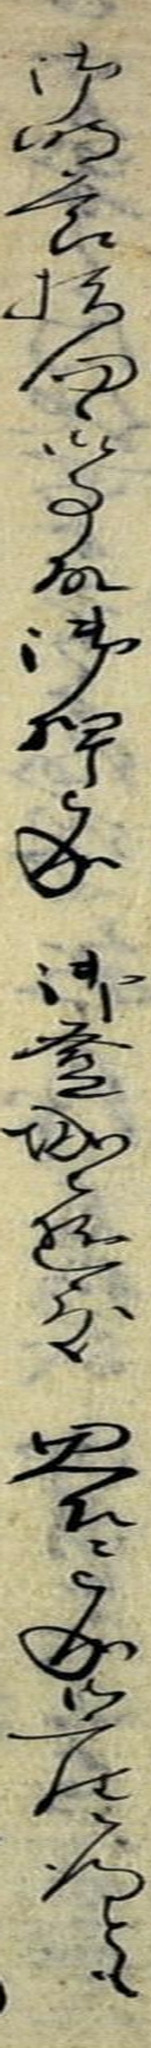御時節指向候御事故御押被成御登城被遊度思召ニ被成御座候得とも
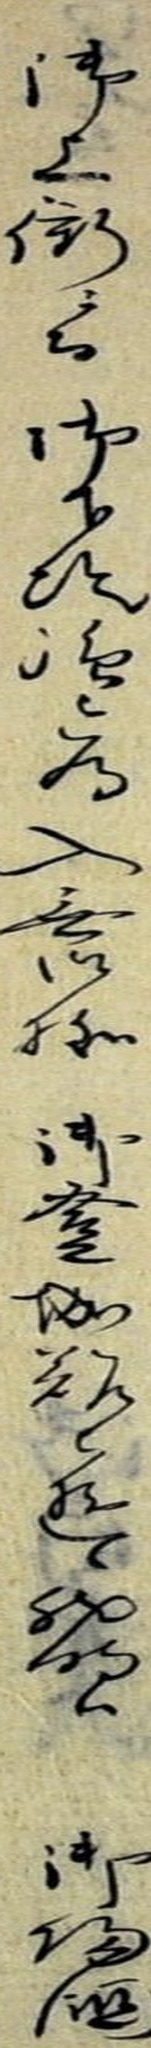御上衝ニ而御下冷強被為入無御拠御登城難被遊候然時ハ御帰国
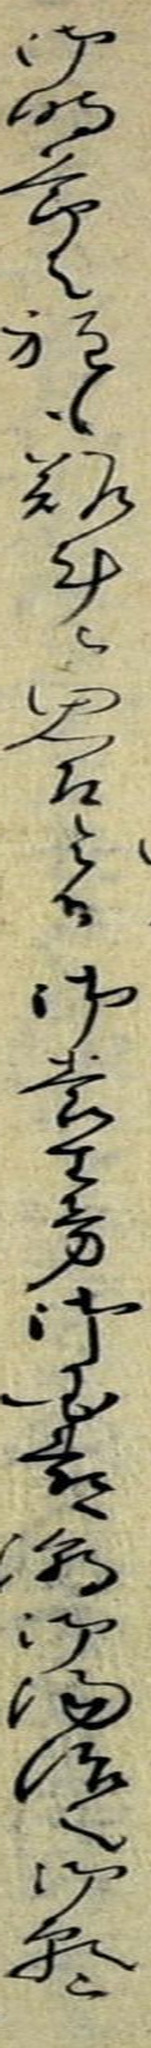御時節之程も難計被思召候ニ付御養生旁御国表へ潮御湯治之御願被
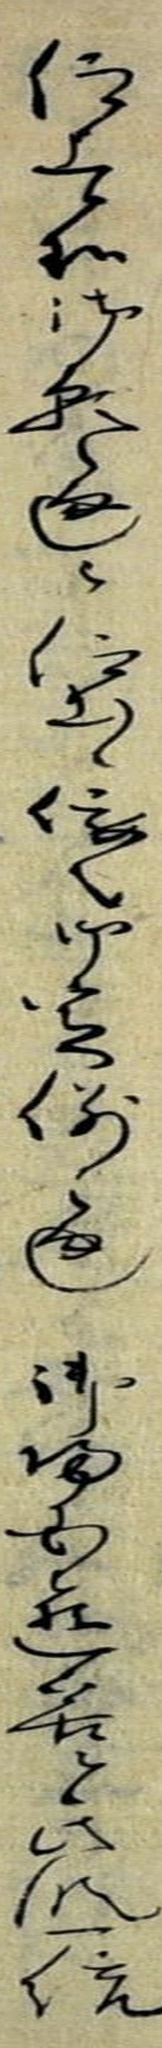仰上候処御願之通被仰出候依之御定例之通御帰国被遊筈ニ候此段一統
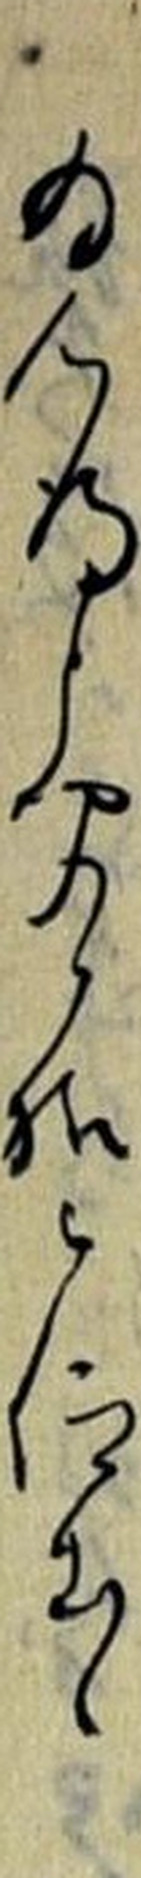為心得申聞候様被仰出候
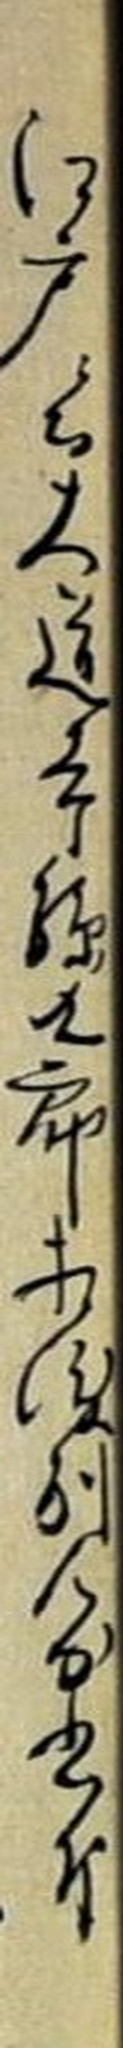江戸ニ而大道寺孫九郎相渡別紙書付
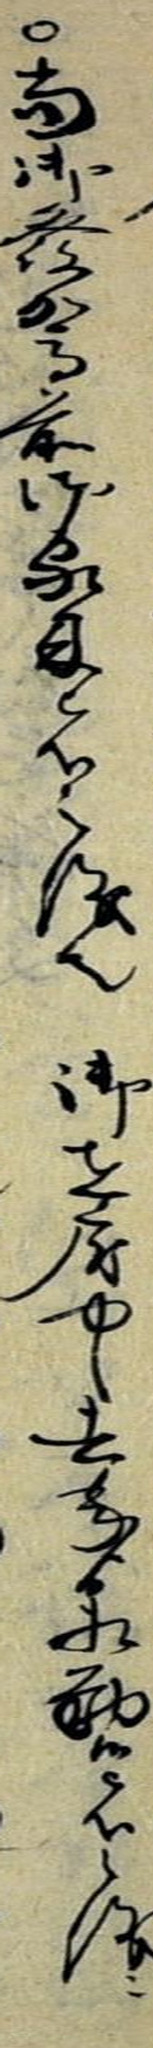〇当御発駕前御家来被下之儀者御在府中去年ゟ相勤候被下之儀ニ
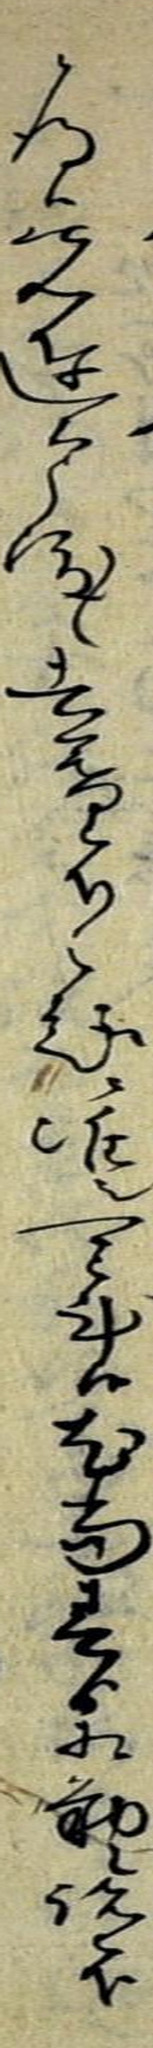候得ハ先達而申渡候去暮被下之趣ニ准シ可被取計候尤当春ゟ相勤之諸被下
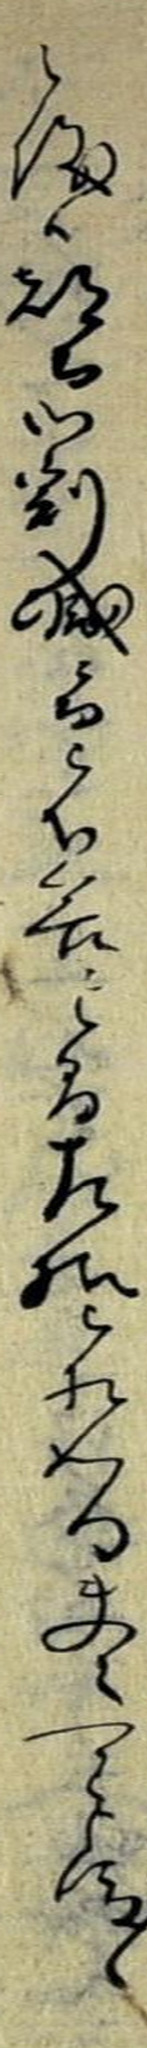之儀ハ都而御割減ニ而被下筈ニ候間左様被相心得夫々可被申渡候
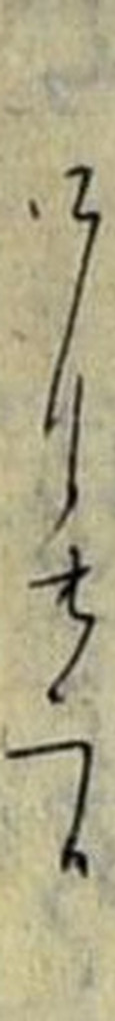四月廿二日
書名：命令之部 三
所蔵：福井県文書館 Fukui Prefectural Archives
